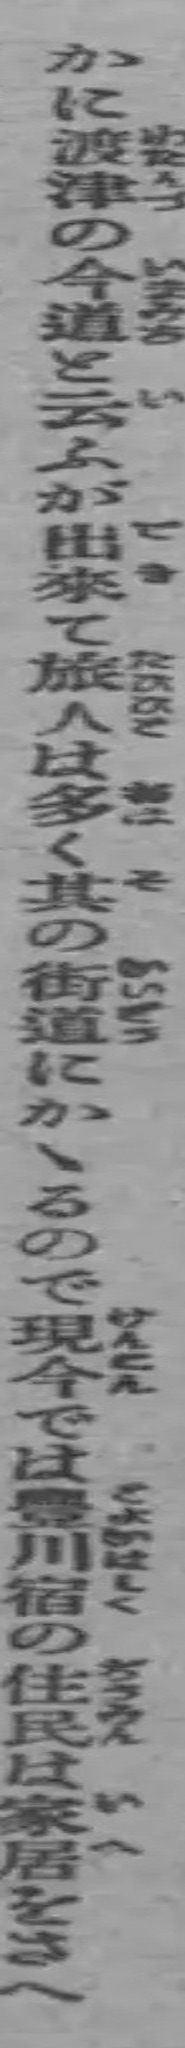かに渡津の今道と云ふが出来て旅人は多く其の街道にかゝるので現今では豊川宿の住民は家居をさへ
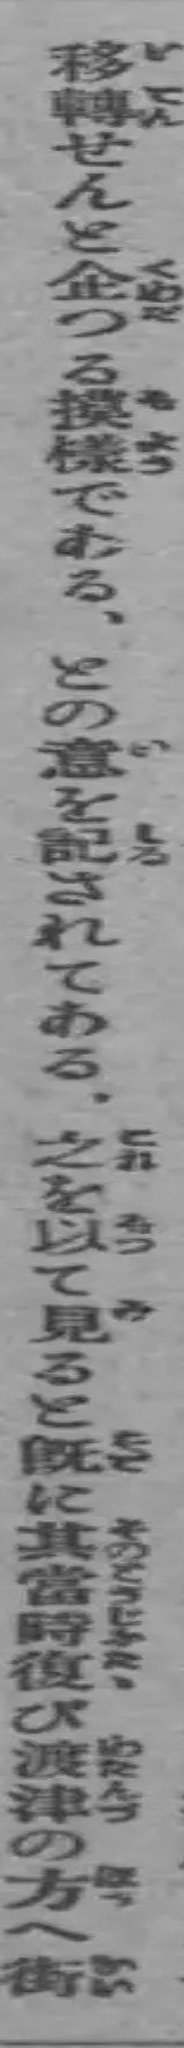移転せんと企つる模様である、との意を記されてある、之を以て見ると既に其当時復び渡津の方へ街
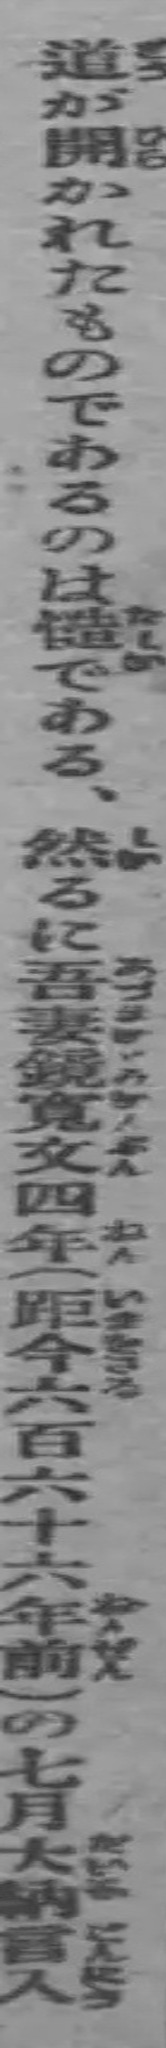道が開かれたものであるのは慥である、然るに吾妻鏡寛文四年(距今六百六十六年前)の七月大納言入
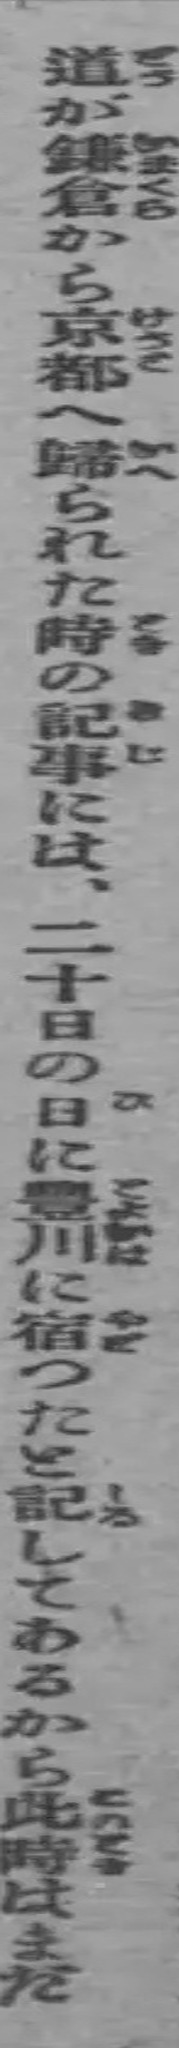道が鎌倉から京都へ帰られた時の記事には、二十日の日に豊川に宿つたと記してあるから此時はまだ
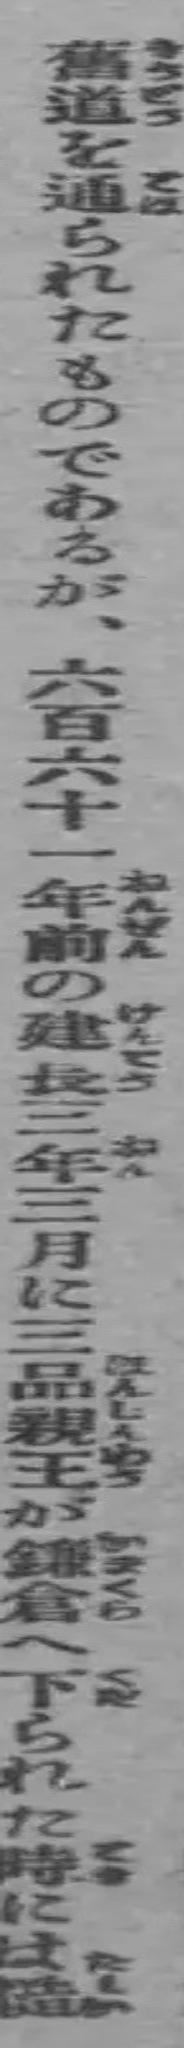旧道を通られたものであるが、六百六十一年前の建長三年三月に三品親王が鎌倉へ下られた時には慥
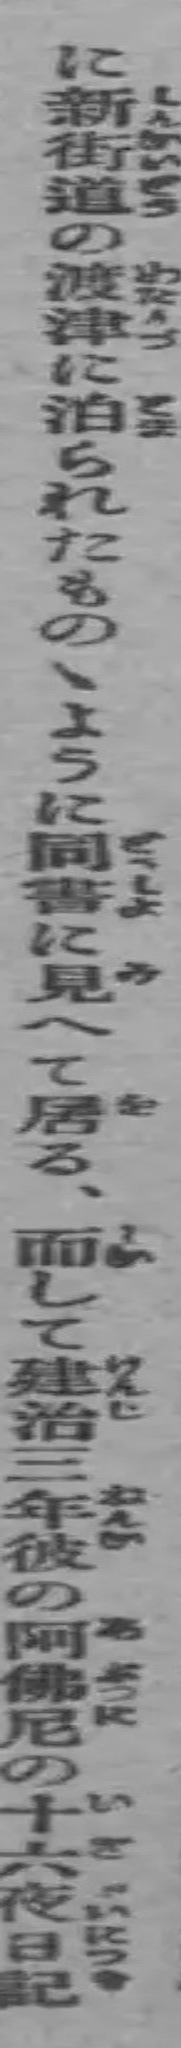に新街道の渡津に泊られたものゝように同書見へて居る、而して建治三年彼の阿仏尼の十六夜日記
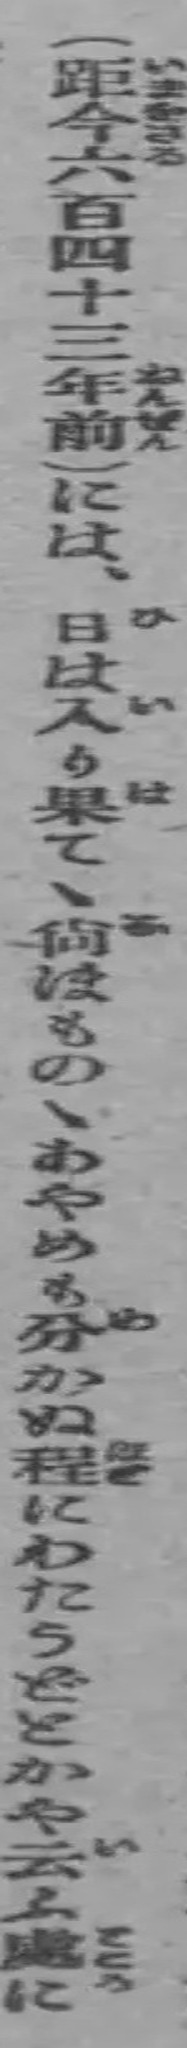(距今六百四十三年前)には、日は入り果てゝ尚ほものゝあやめも分かぬ程にわたうどとかや云ふ処に
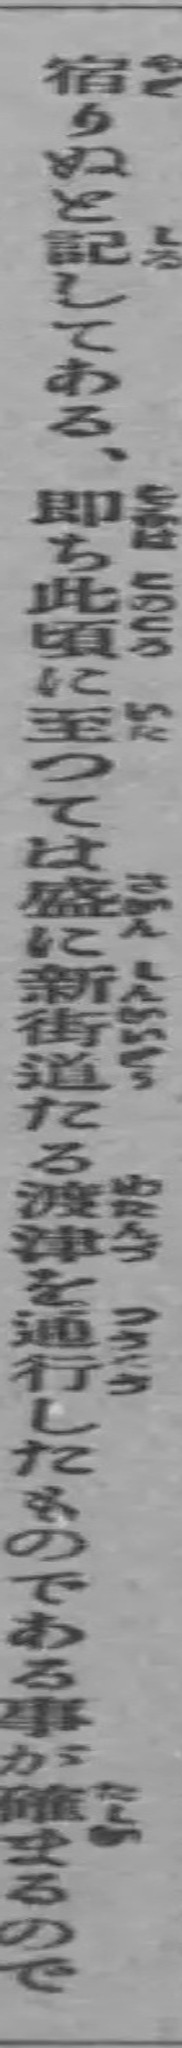宿りぬと記してある、即ち此頃に至つては盛に新街道たる渡津を通行したものである事が確まるので
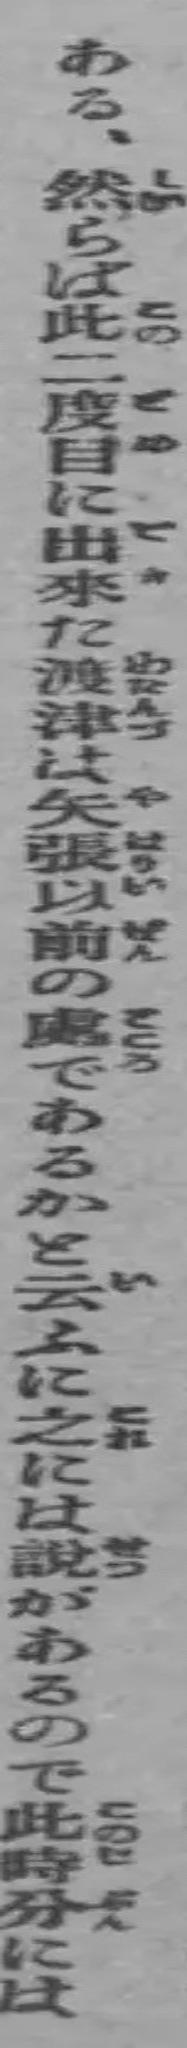ある、然らば此二度目に出来た渡津は矢張以前の処であるかと云ふに之には説があるので此時分には
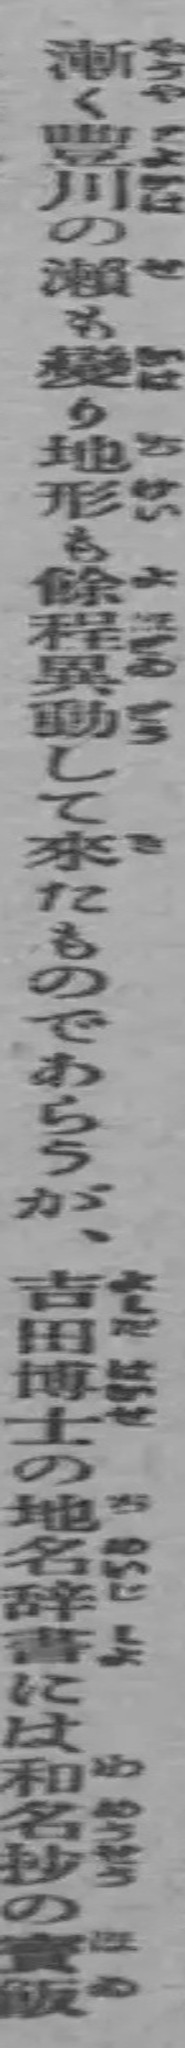漸く豊川の瀬も変り地形も余程異動して来たものであらうが、吉田博士の地名辞書には和名抄の宝飯
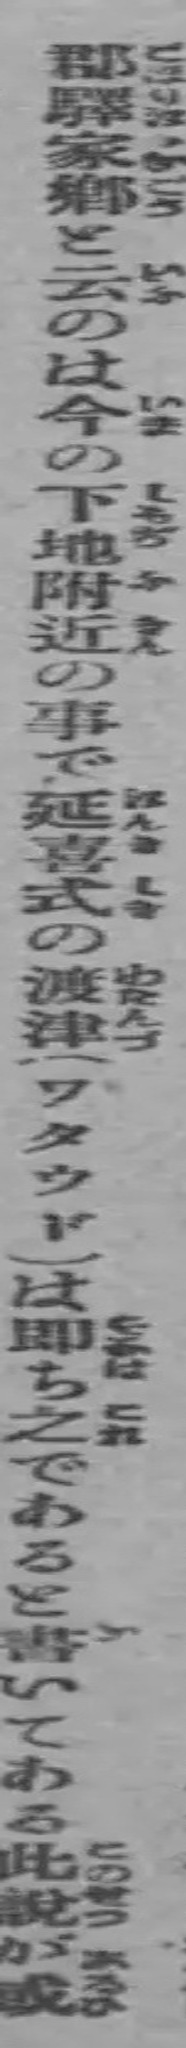駅家郷郡駅家郷と云のは今の下地附近の事で延喜式の渡津(ワタウド)は即ち之であると書いてある此説が或
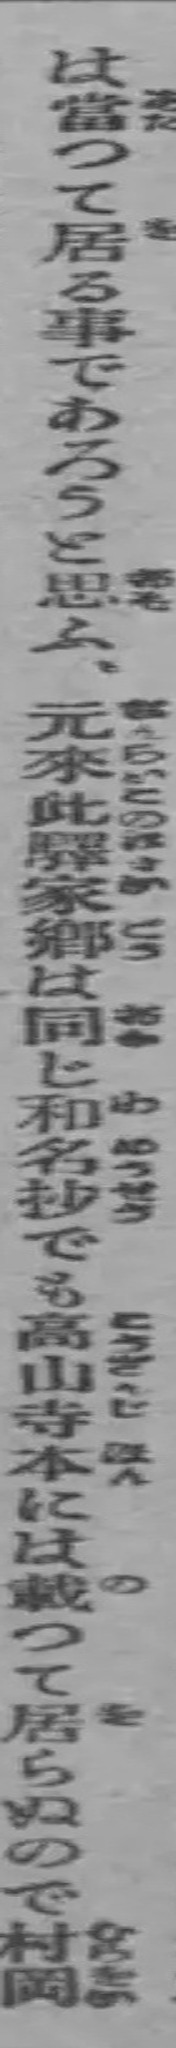は当つて居る事であろうと思ふ、元来此駅家郷は同じ和名抄でも高山寺本には載つて居ららぬので村岡
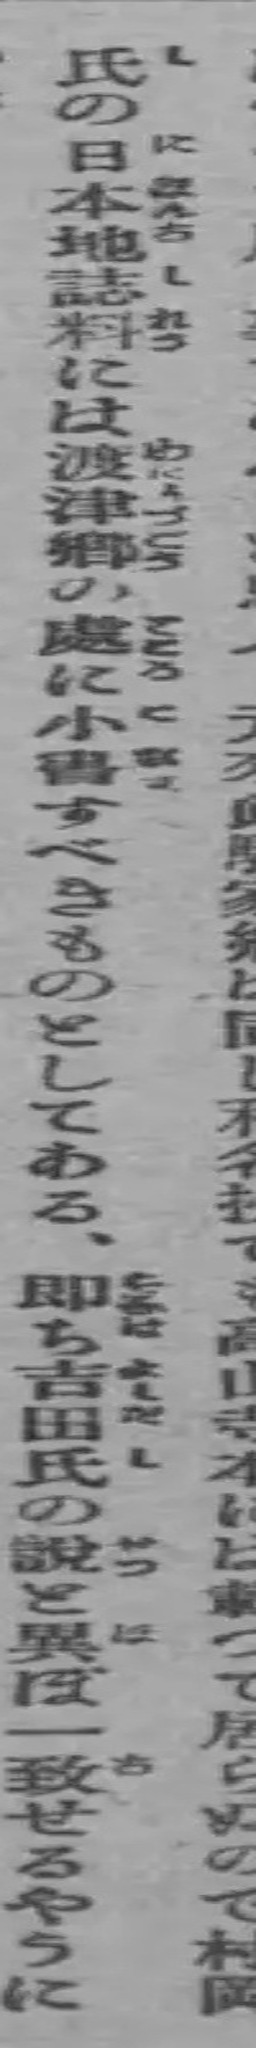氏の日本地誌料には渡津郷の処に小書すべきものとしてある、即ち吉田氏の説と異ぼ一致せるやうに
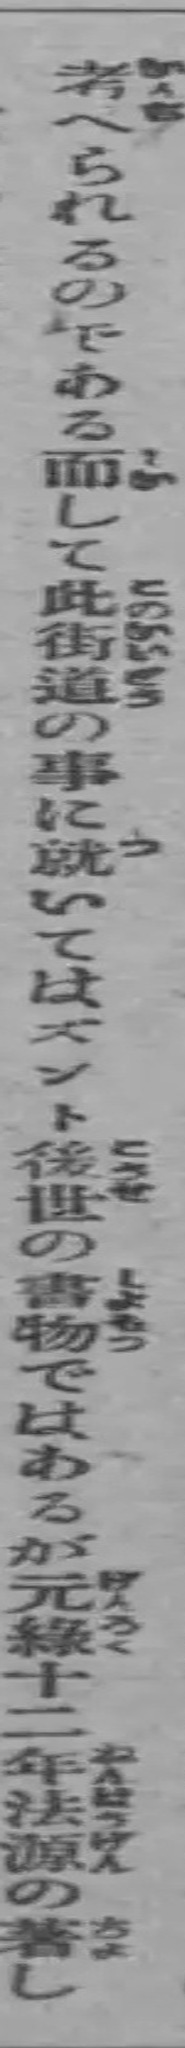考へられるのである而して此街道の事に就いてはズント後世の書物ではあるが元禄十二年法源の著し
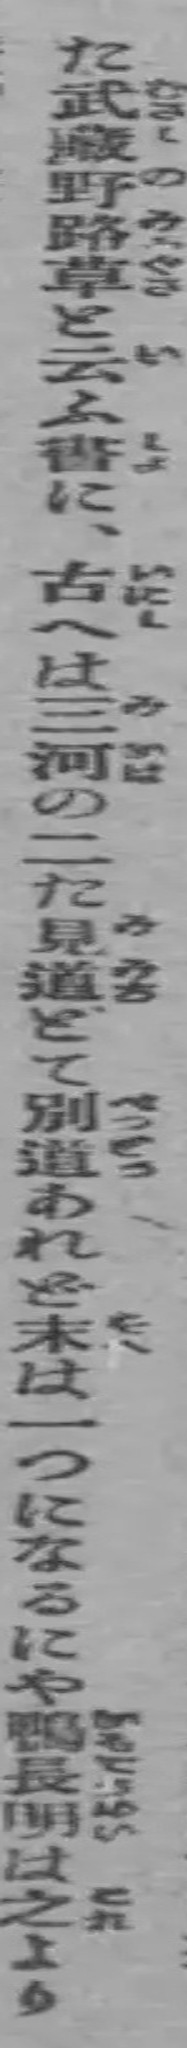た武蔵野路草と云ふ書に、古へは三河の二た見道とて別道あれど末は一つになるにや鴨長明は之より
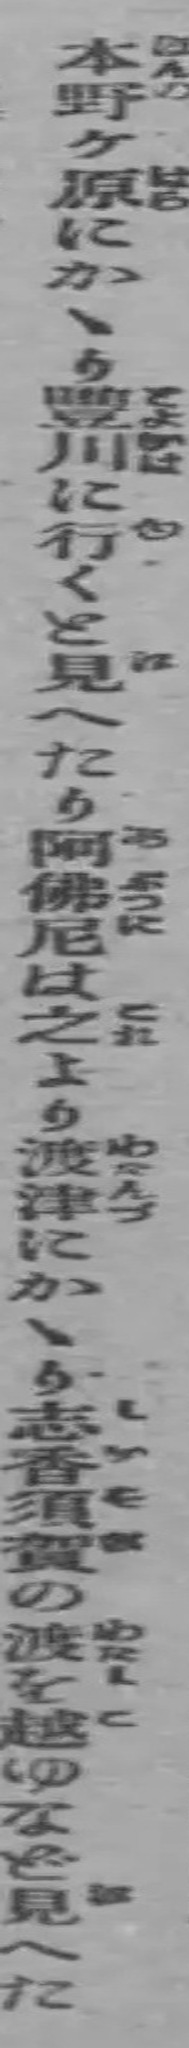本野ケ原にかゝり豊川に行くと見へたり阿仏尼は之より渡津にかゝり志香須賀の渡を越ゆなど見へた
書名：豊橋市史談
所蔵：国立国会図書館 National Diet Library, JAPAN
